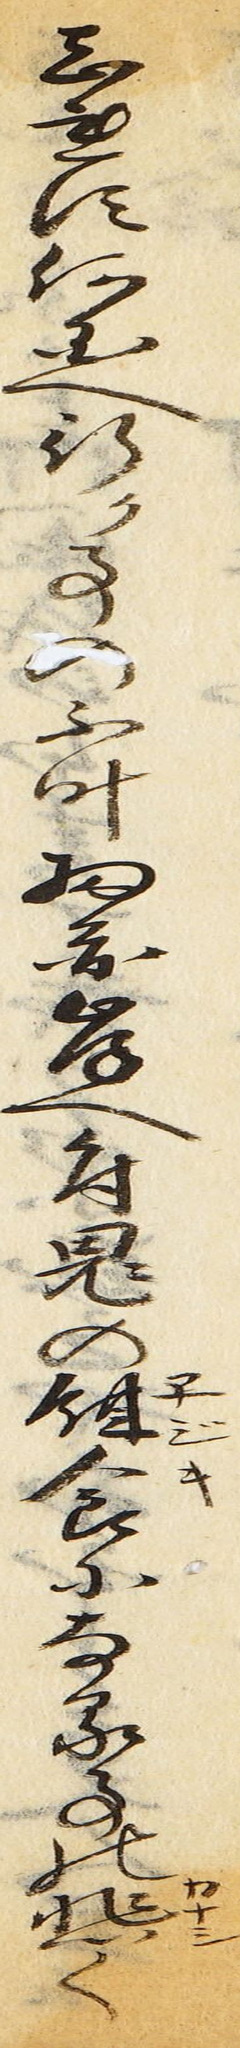しれす何国へ行ㇰ事の不叶岸へ付鬼の餌食になる事の悲く
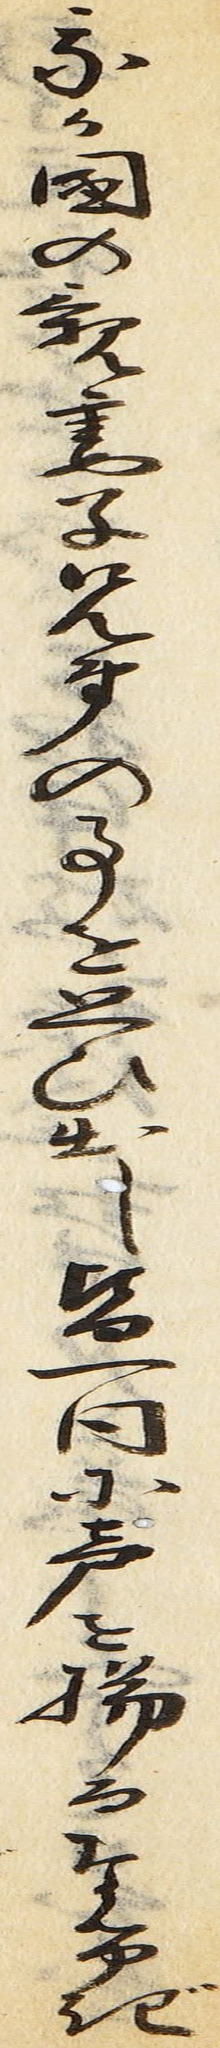我か国の親妻子兄弟の事を思ひ出し皆一同小声を揚而なけぎ
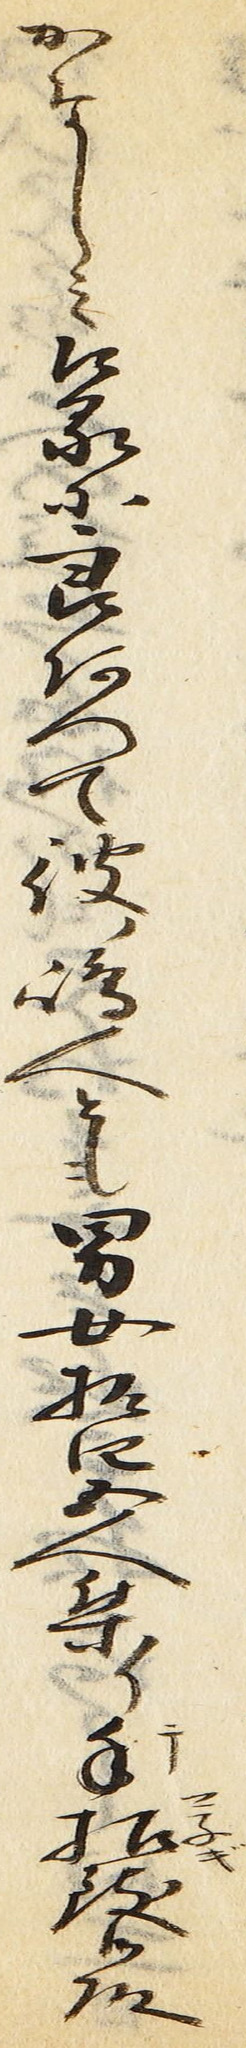かなしみけるに良あつて彼ノ嶋人とも男女拾四五人集り手招致候故
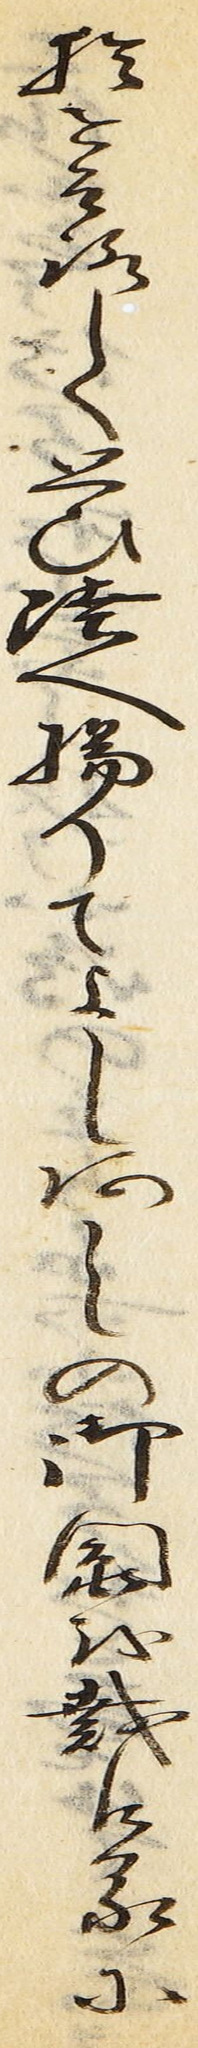猶をそろしく思ひ陸へ揚りてよしあしの御鬮を戴けるに
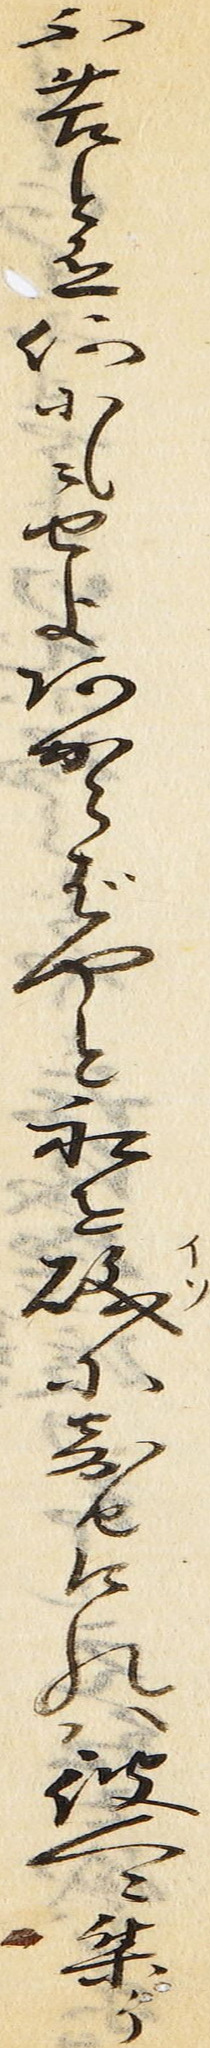不苦と有何にもせよあからばやと船を礒に寄せけれは彼人々集り
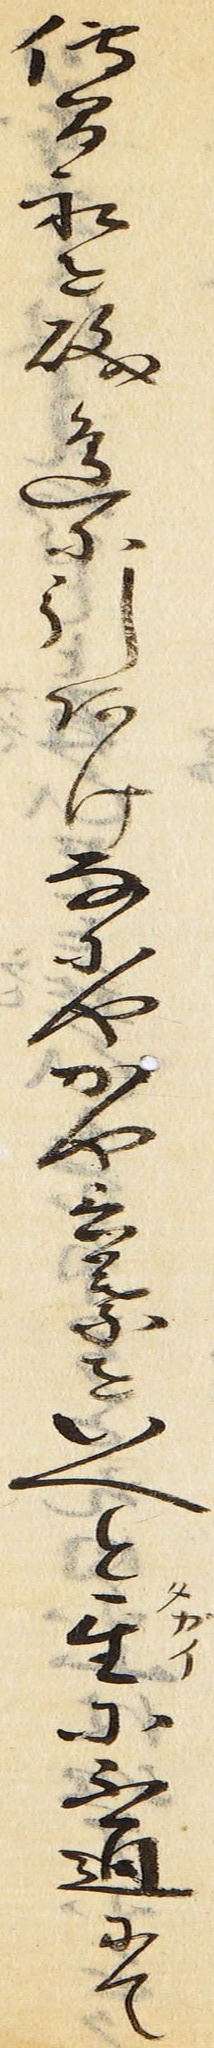伝間船を礒辺に引あけなにやかや言葉をいへと互に不通にて
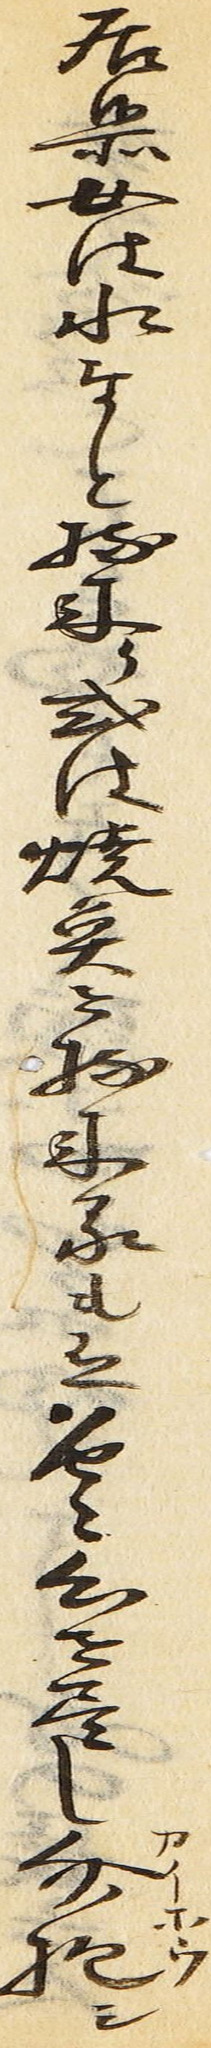居候所女は水なと持来或は焼魚を持来るも有色々心を尽し介抱
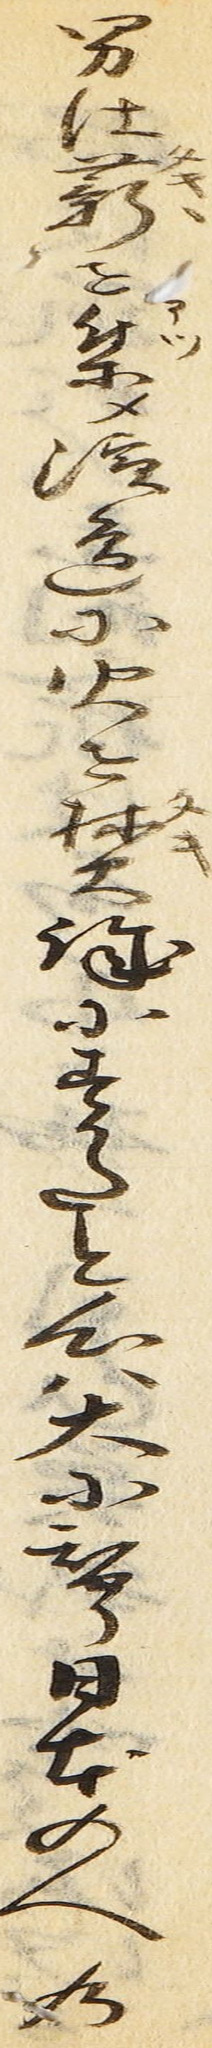男は薪を集メ浜辺に火を焚誠にすかたと心は大に替り日本の人為
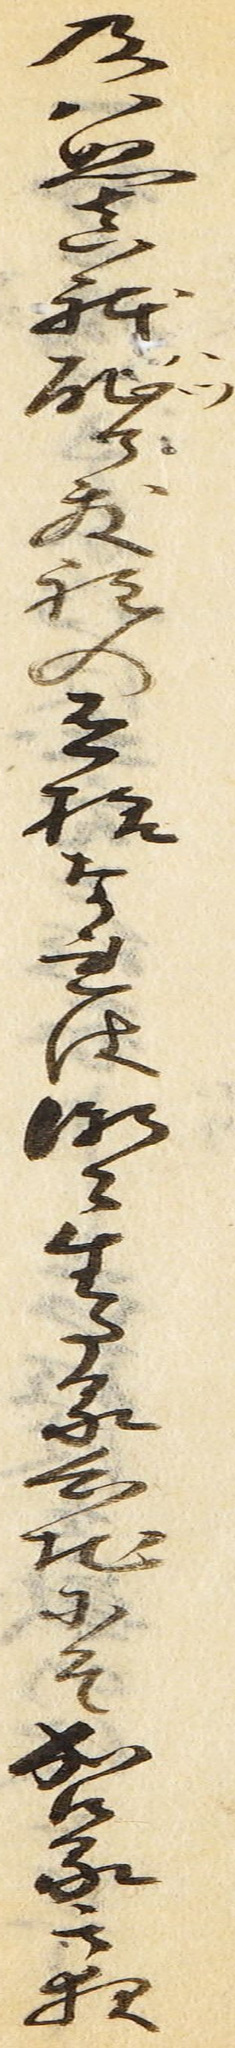及はぬ真躰恥ヶ敷程の有様なれは漸々生たる心地にて成ける其夜
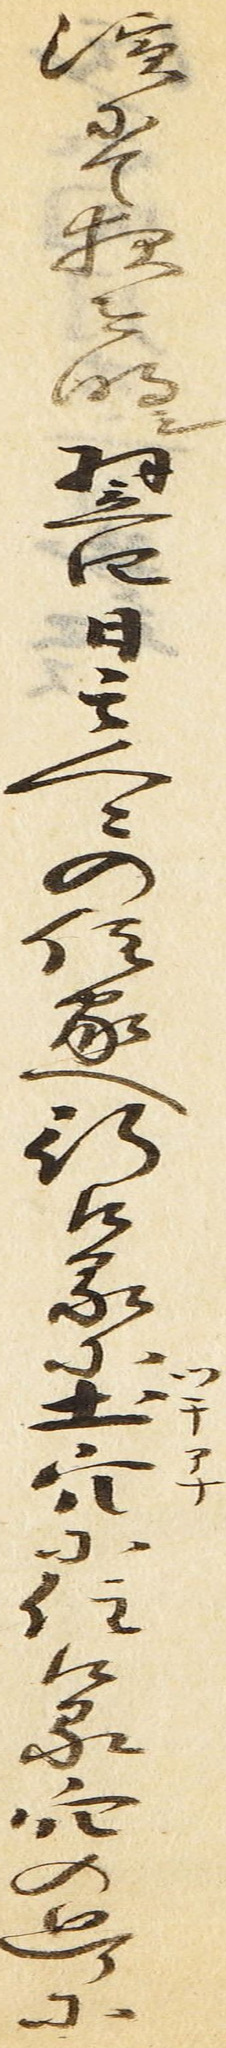浜にて夜を明翌四日其人々の住家へ行けるに土穴に住ける穴の廻に
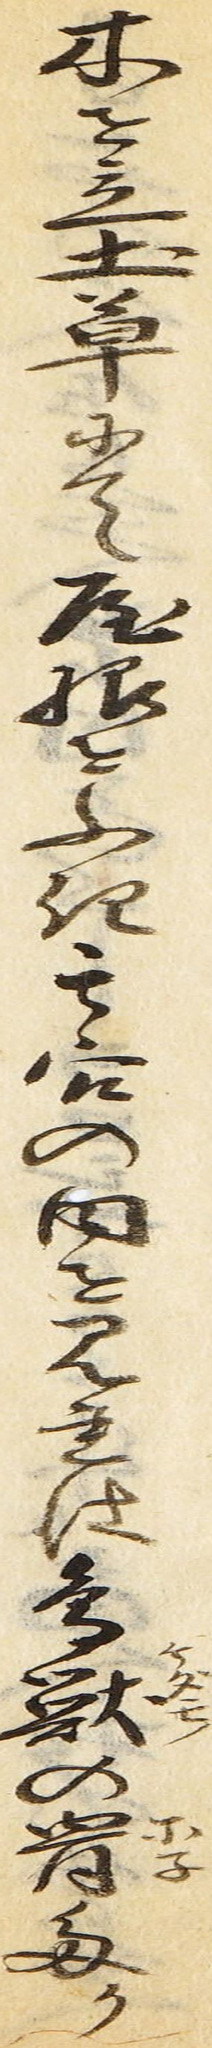木を立土草にて屋根をふき其穴の内を見れは鳥獣の骨多ㇰ
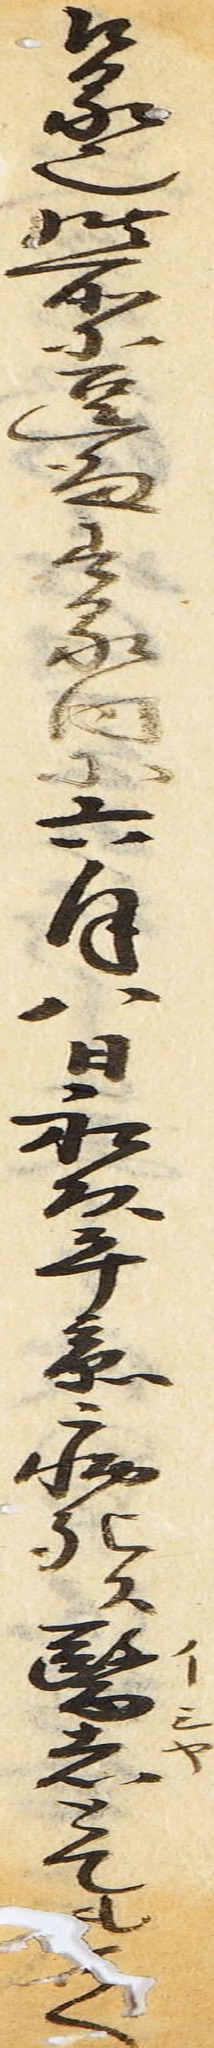ける也此所に逗留する内に六月八日船頭平兵衛病死ㇲ医者とてもなく
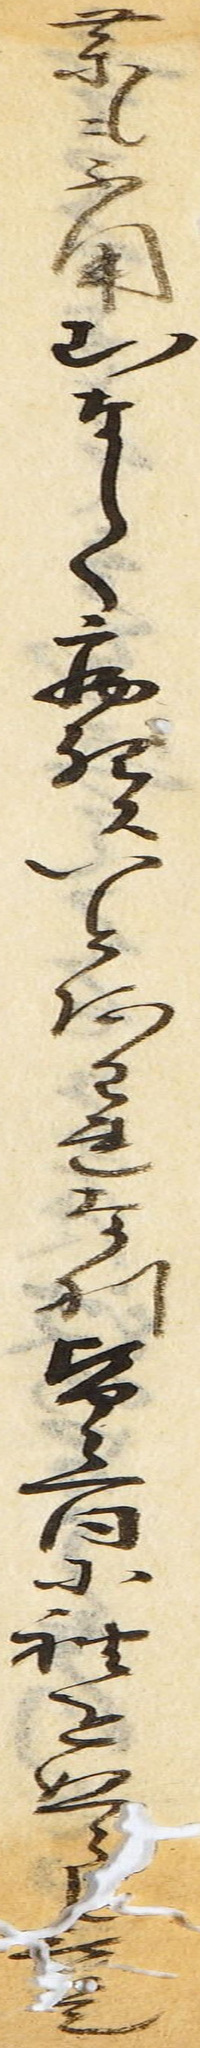薬も不用むなしく病死ㇲいとあわれなり皆々一同に袖をぬらし無是
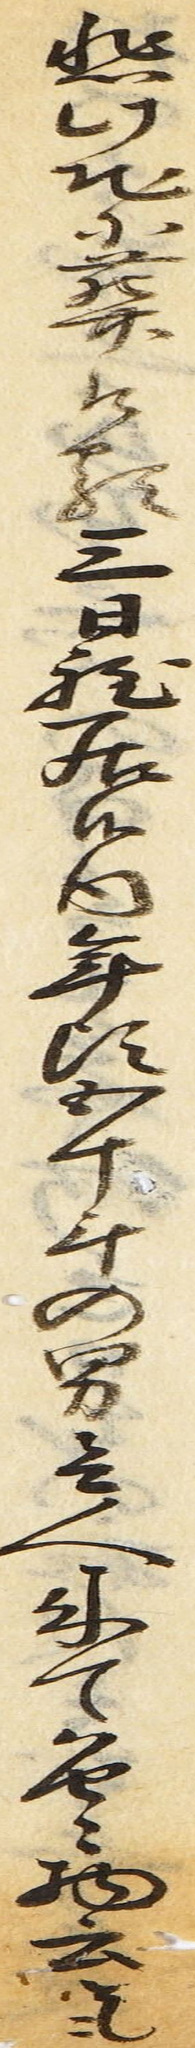悲此地に葬ける三日程居候内年頃五十計の男壱人来て色々物言とも
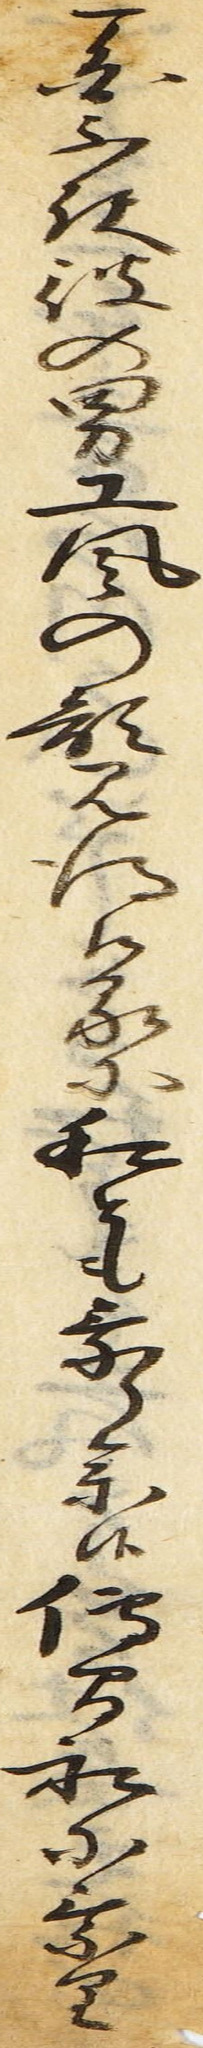一国不訳彼の男工風の顔見得けるに私とも乗り参候伝間船に乗り

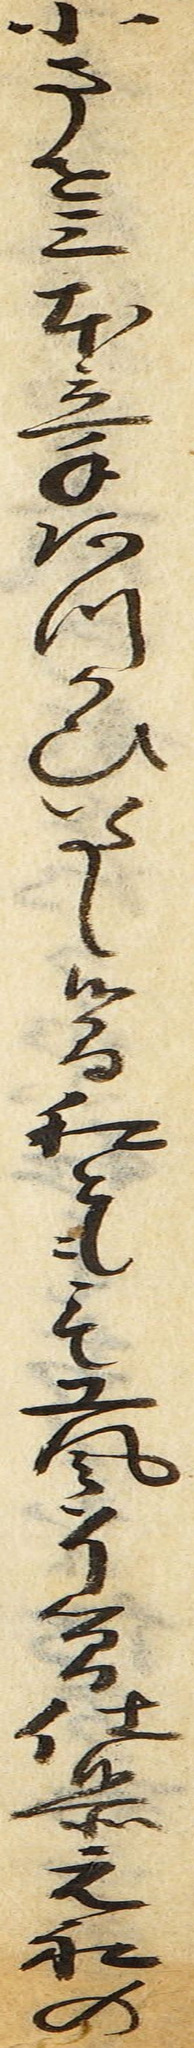小さを三本立手あつかひいたし候間私ともも工風了簡仕候所元船の
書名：外国漂流記
